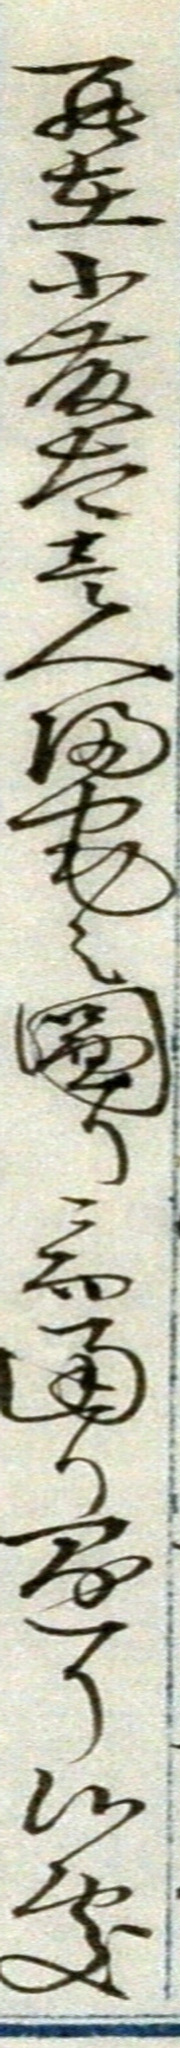罷在小藤太壱人帰宅之図り二而通り懸り候處
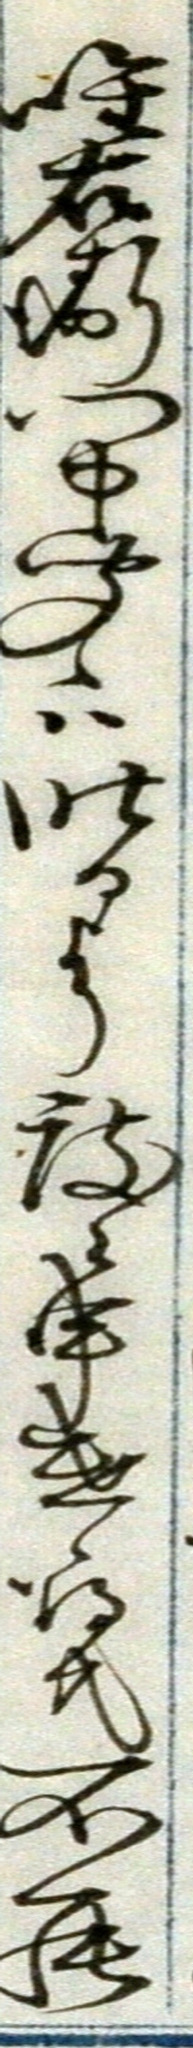唯右衛門申聞候ハ昨日より度々申遣候得共不罷
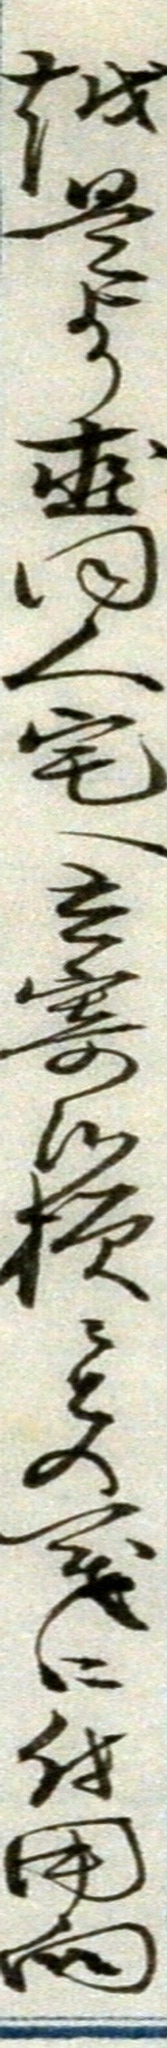越是より直同人宅へ立寄候様ニとの義に付用向
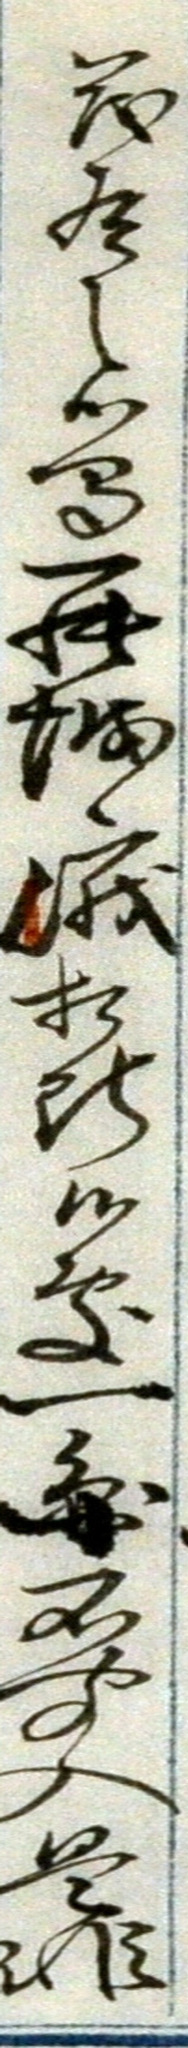茂有之候間罷越候儀相断候處一圓不聞入是非
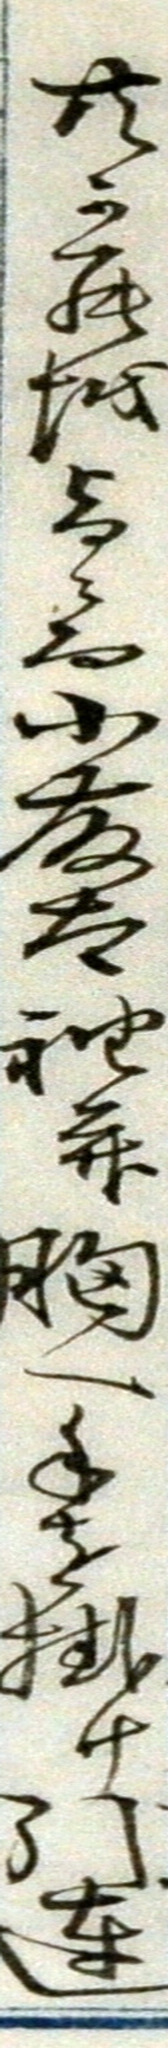共可罷越旨ニ而小藤太袖幷胸へ手を掛け引連
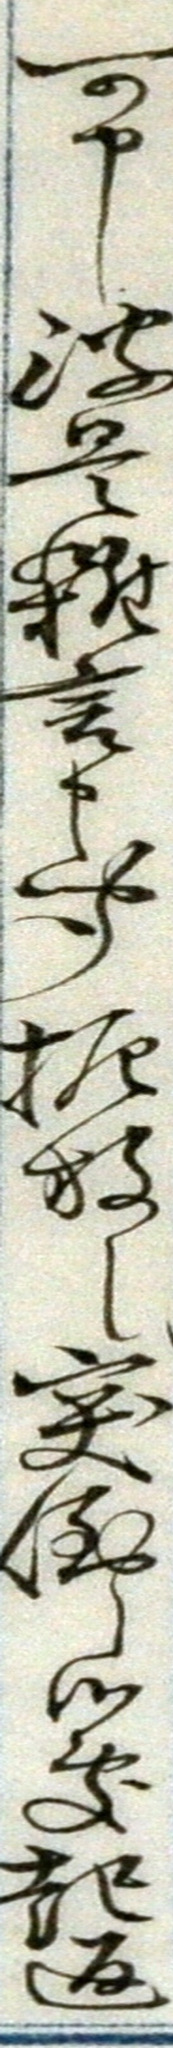可申彼是雑言申聞振放し突倒し候處起返
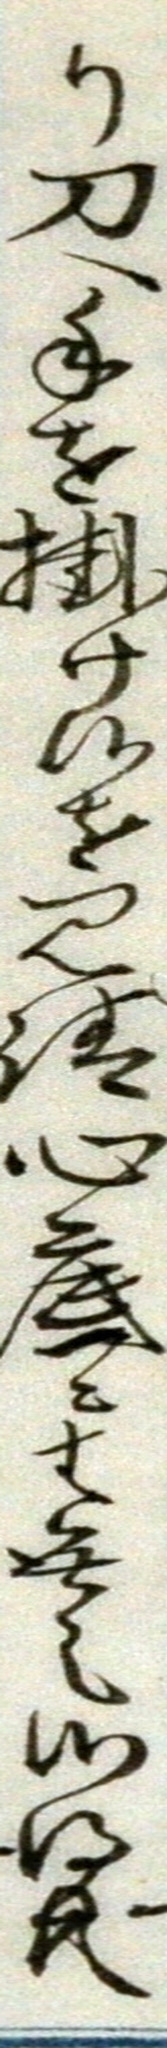り刀へ手を掛け候を見請心底ニ者無之候得共
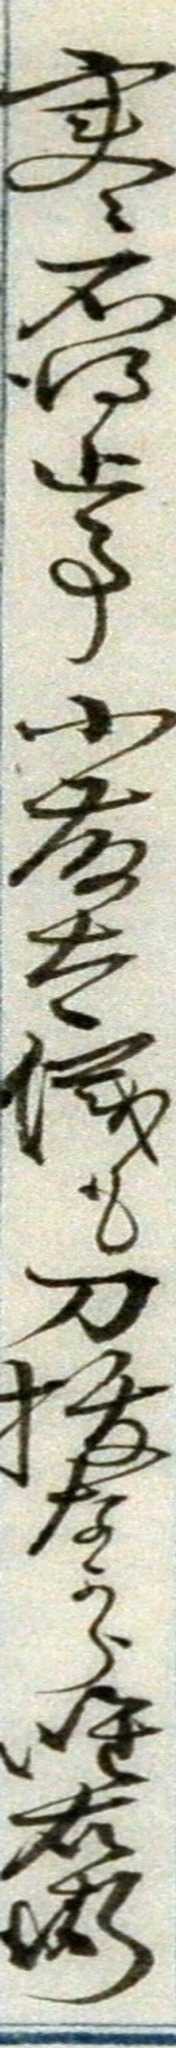実ニ不得止事小藤太儀も刀抜な可ら唯右衛
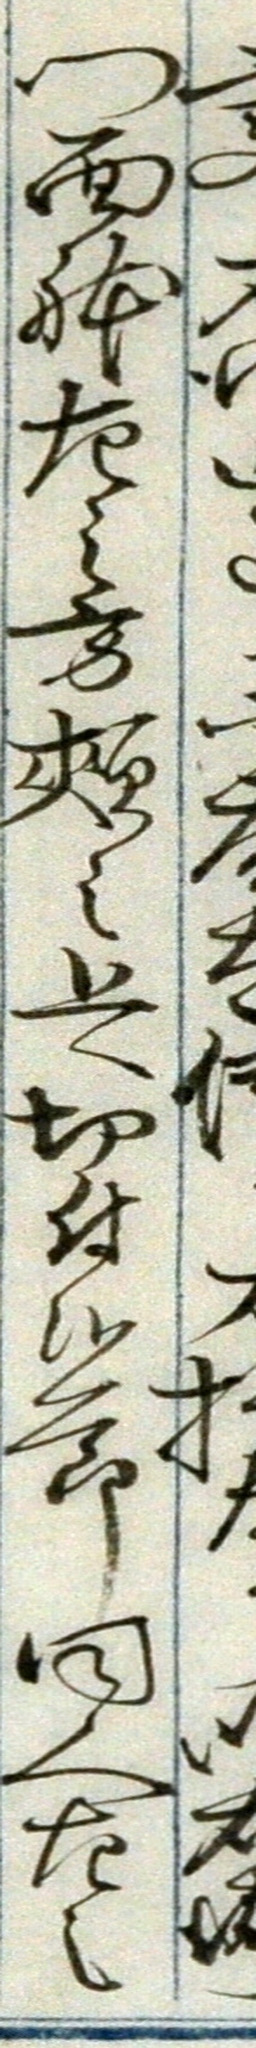門面躰左之方頬之上へ切付候節同人左之
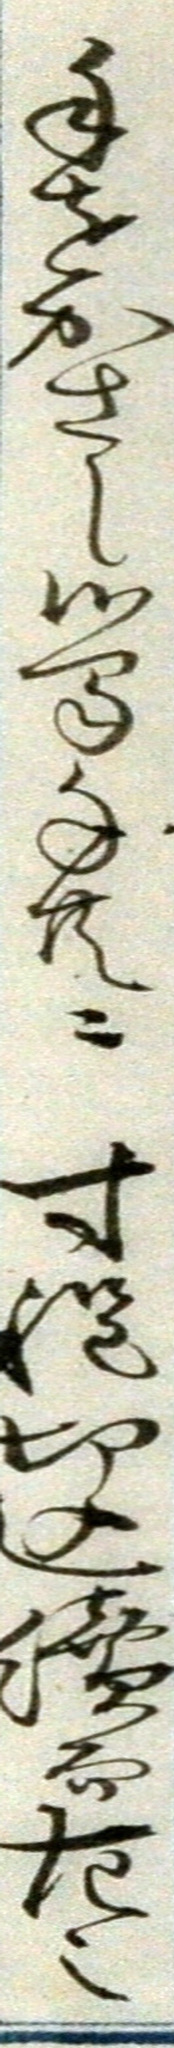手をかさし候間手共ニ寸程切込続而左之
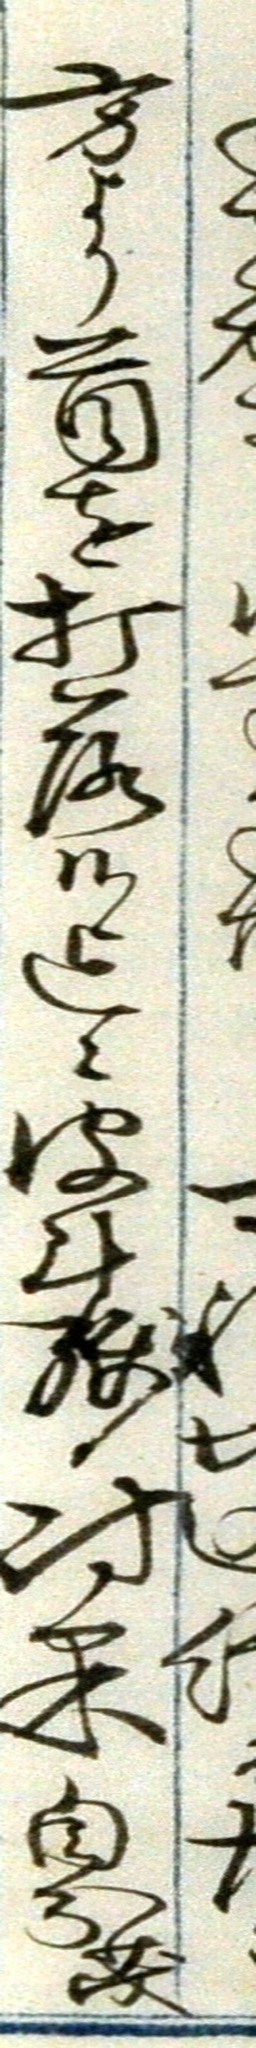方より首を打落候迄ニ皮斗残候討果自分茂

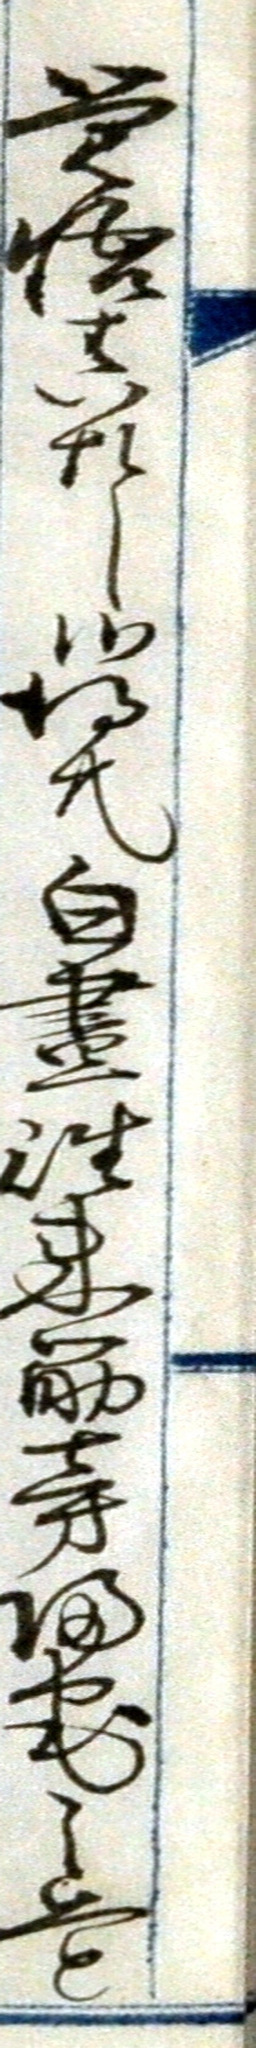覚悟者いたし候得共白昼往来筋旁帰宅之上と
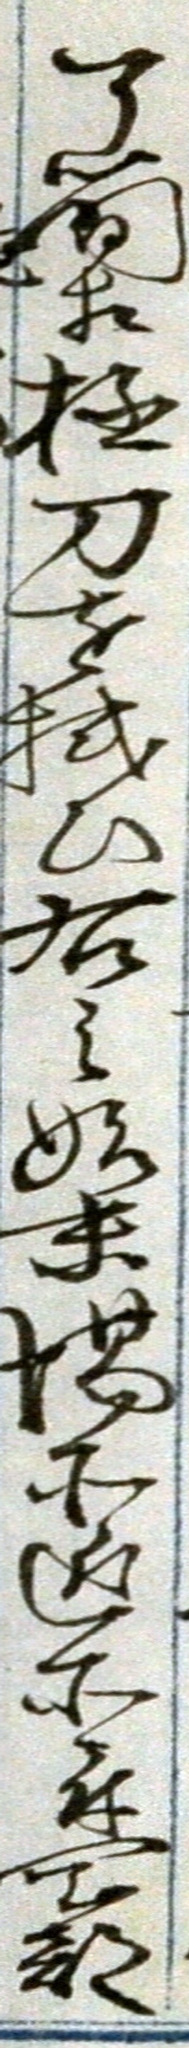了簡相極刀を拭ひ右之始末場所近所ニ付岡部
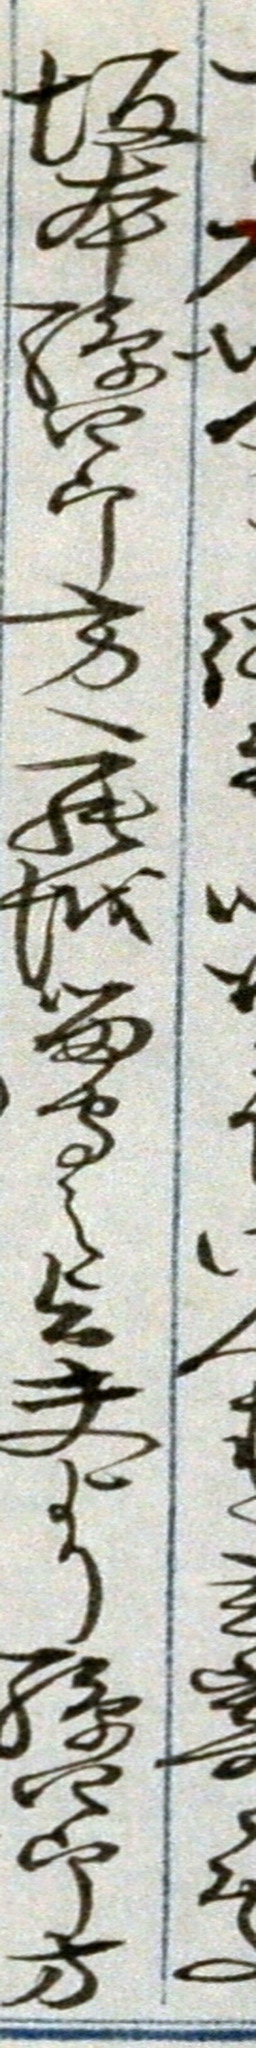坂本孫四郎方へ罷越留守之旨夫より孫四郎方
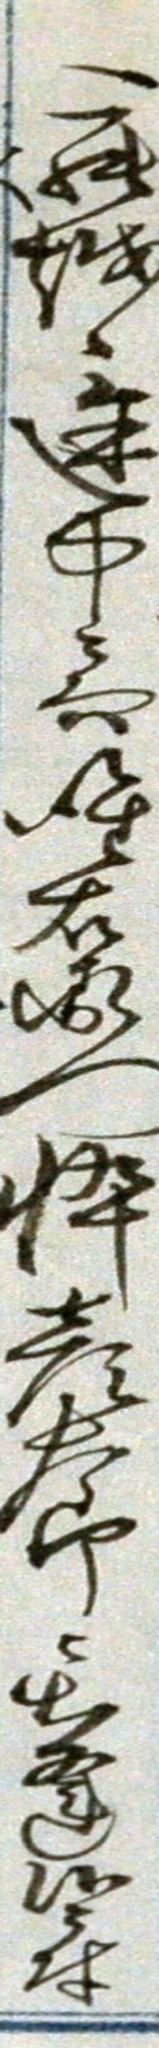へ罷越候途中ニ而唯右衛忰彦太郎ニ出逢候ニ付
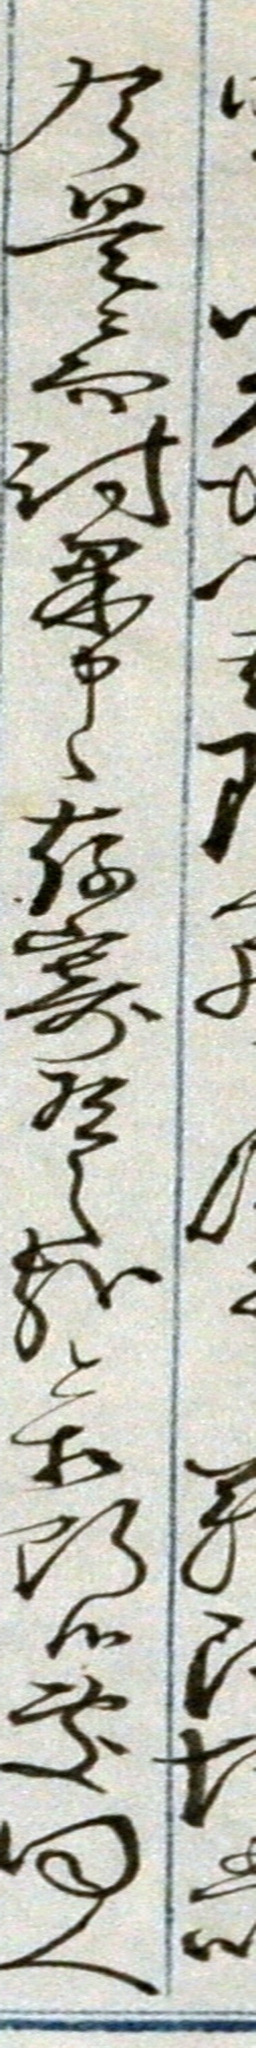今是ニ而討果申候存寄有之哉と相断候處同人
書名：川面小藤太子細有之多賀谷唯右衛門ヲ打果候一件
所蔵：伊那市立高遠町図書館・合同会社AMANE
